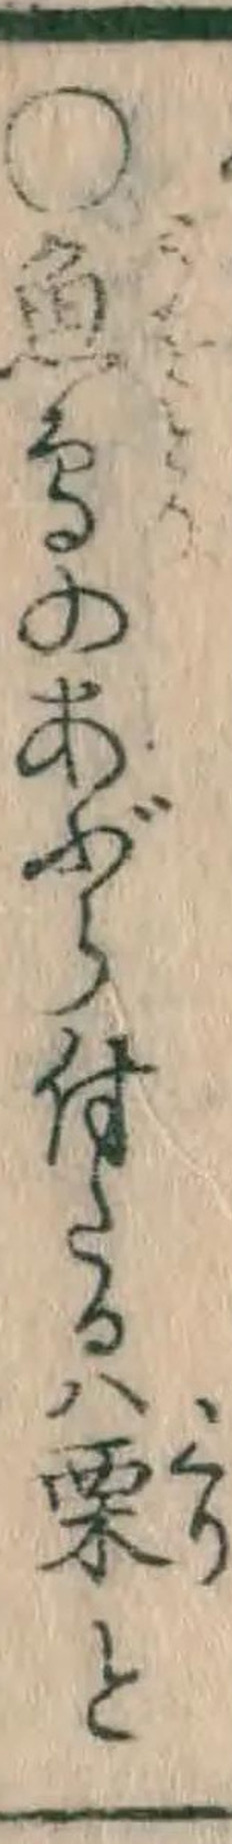○魚鳥のあぶら付たるは栗と
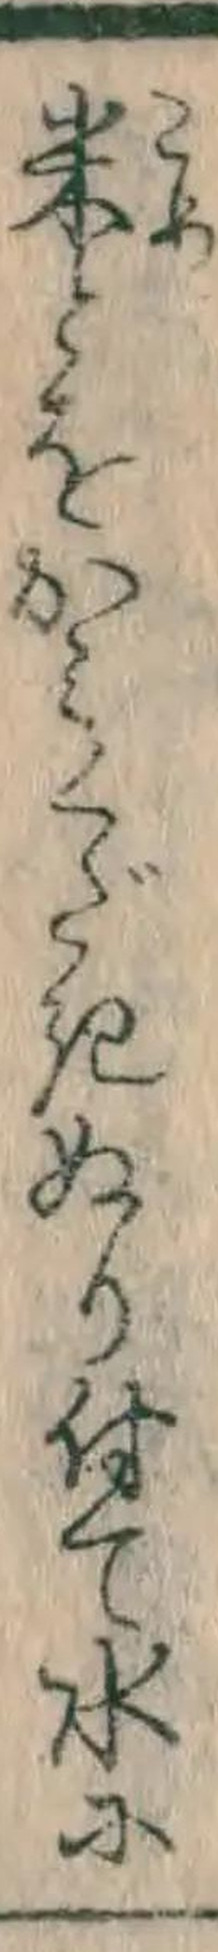米とをかみくだきぬり付て水に

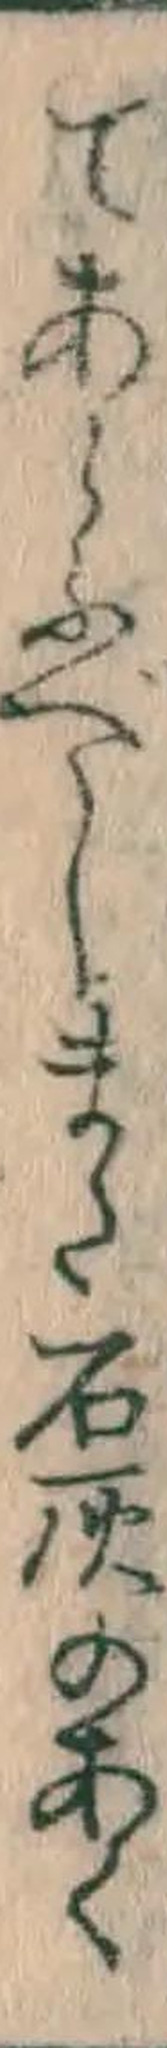てあらふべしまた石灰のあく
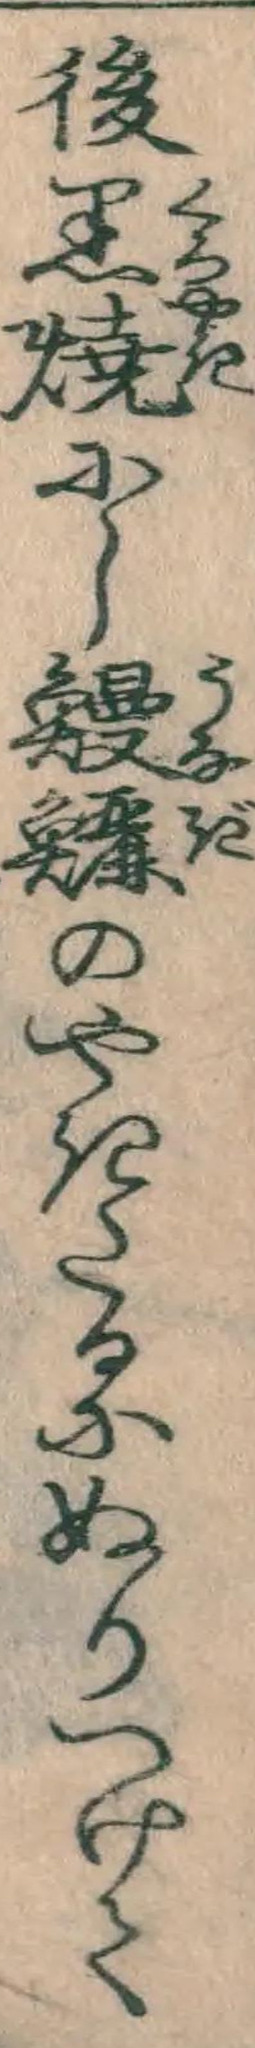後黒焼にし鰻鱺のやきたるにぬりつけて
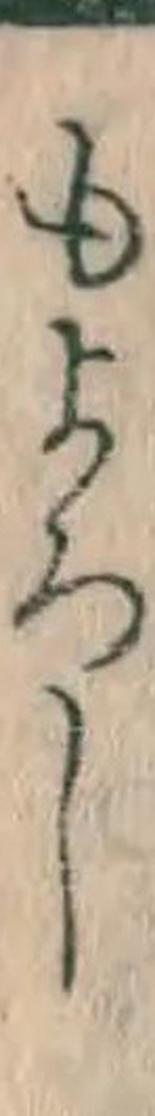もよろし
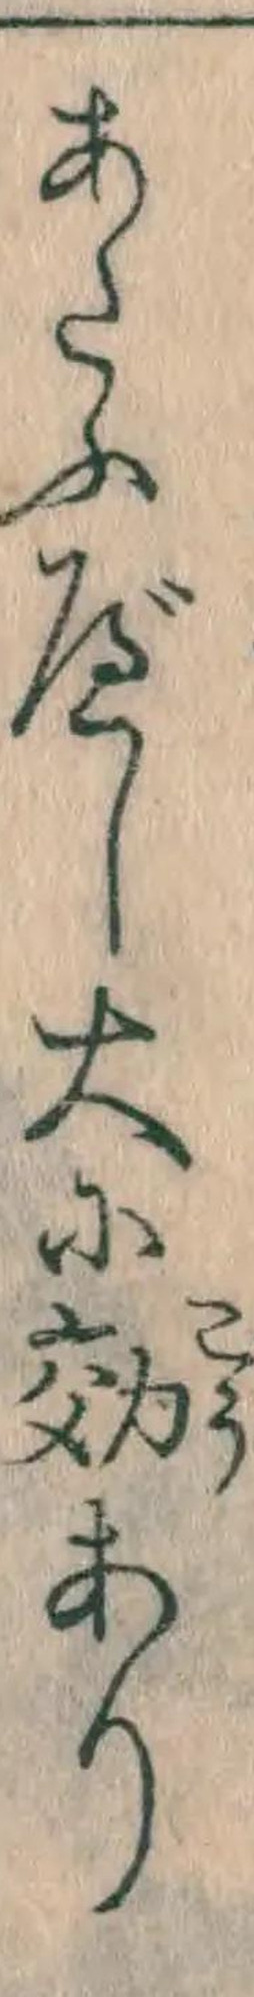あたふべし大に効あり
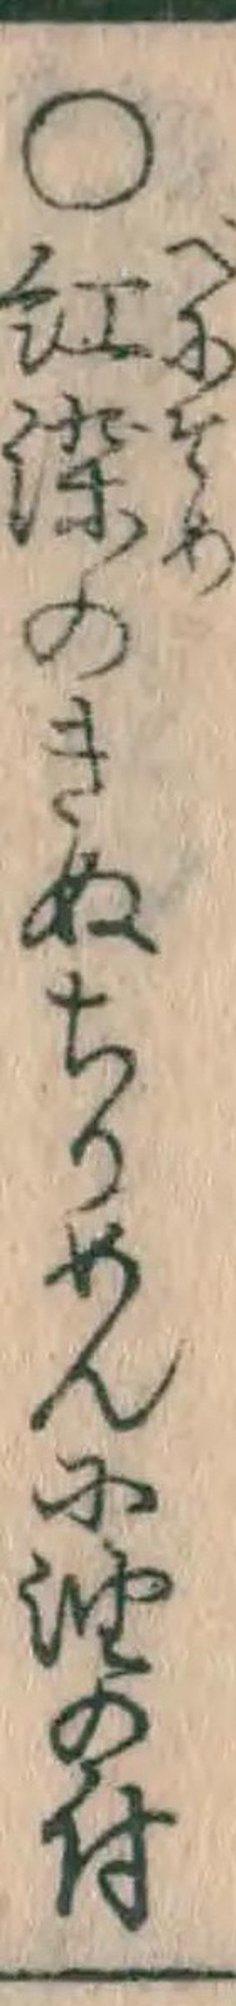○紅染のきぬちりめんに油の付
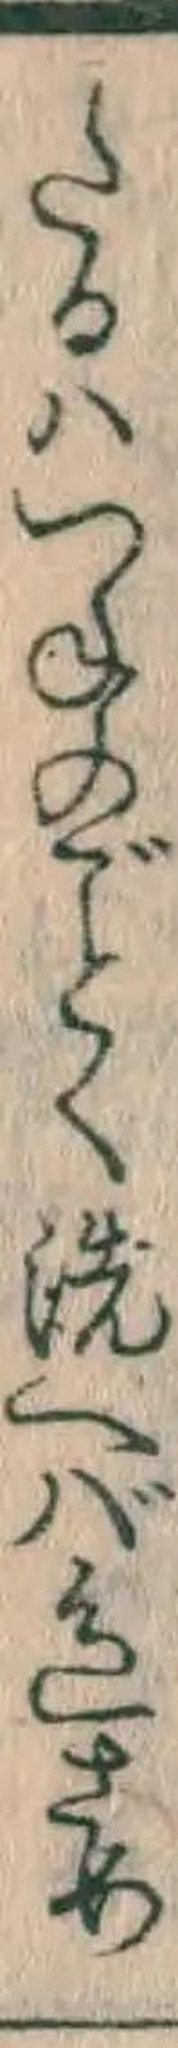たるはつねのごとく洗へば色さめ
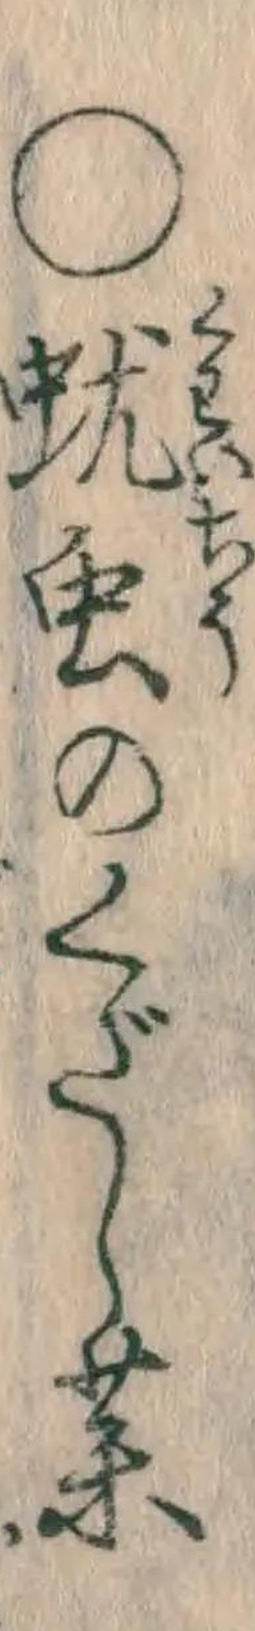○蚘虫のくだし薬
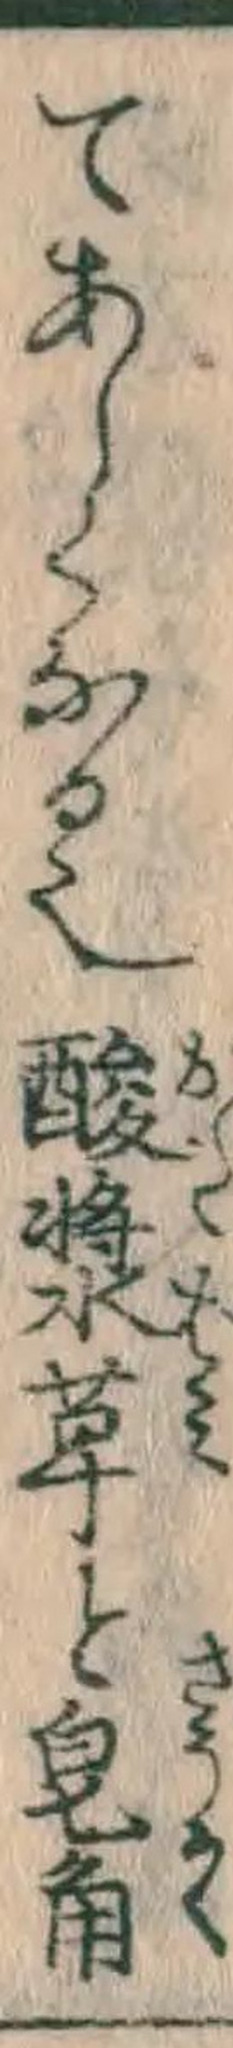てあしくなる也酸漿草と皂角
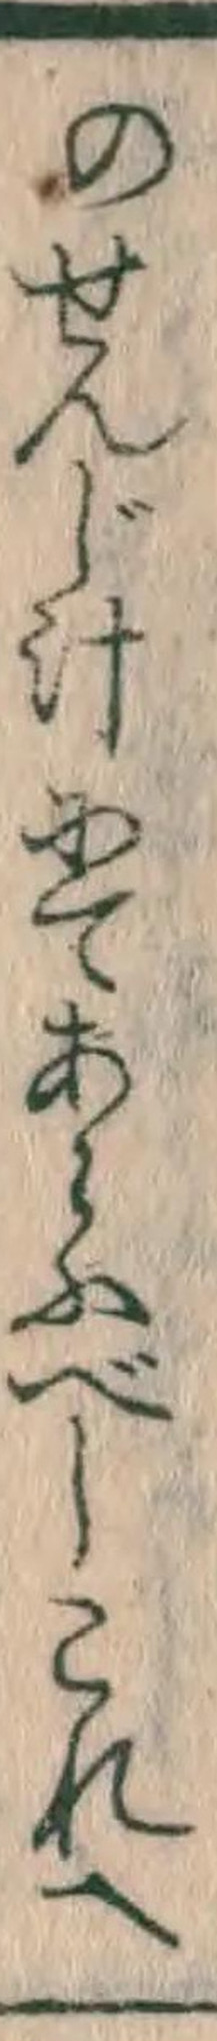のせんじ汁にてあらふべしこれへ
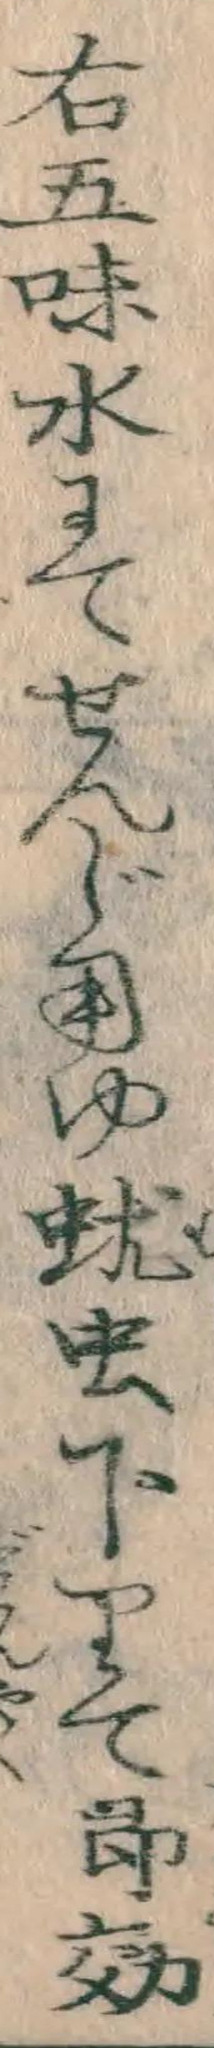右五味水にてせんじ用ゆ蚘虫下りて即効
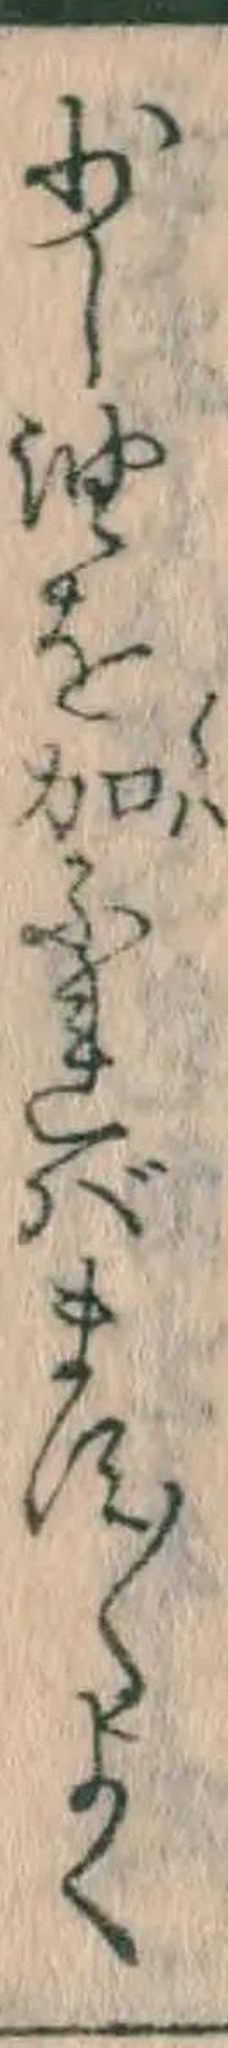少し油を加ふればます〳〵よく
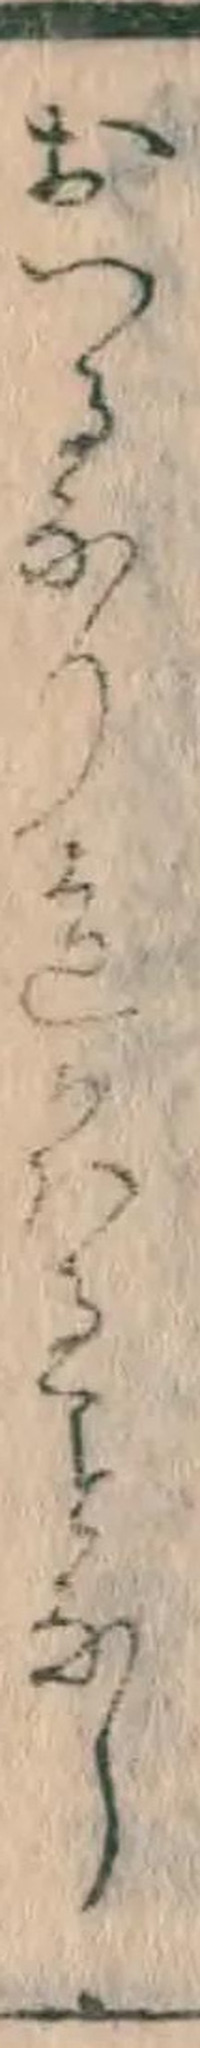おつるなり色かはることなし
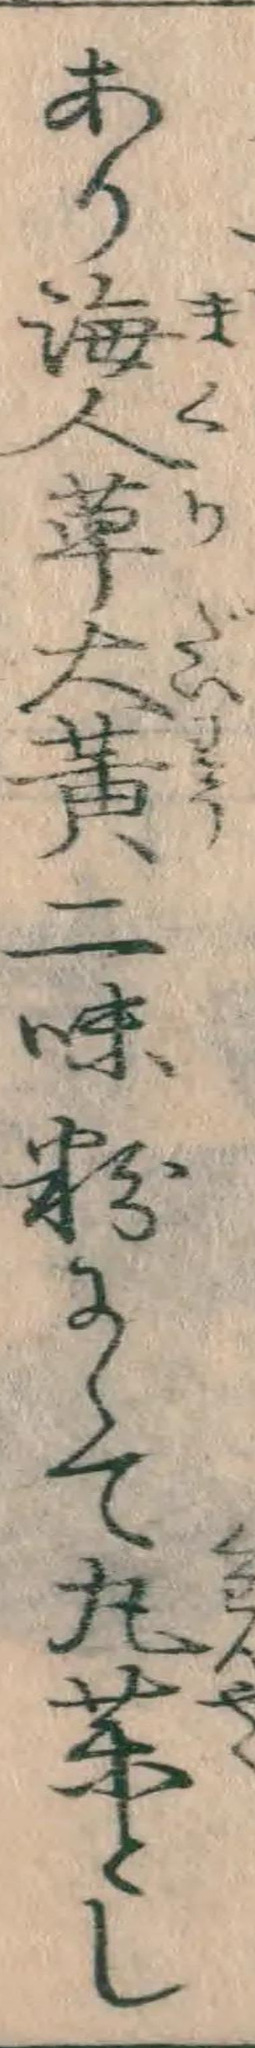あり海人草大黄二味粉にして丸薬とし
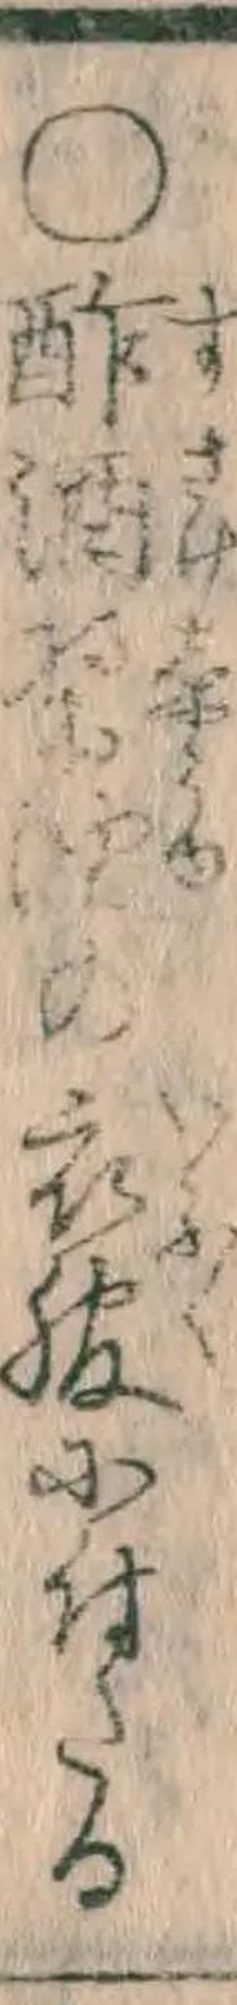○酢酒醤油の衣服に付たる
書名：広益秘事大全 3巻. [3]
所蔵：国立国会図書館 National Diet Library, JAPAN
